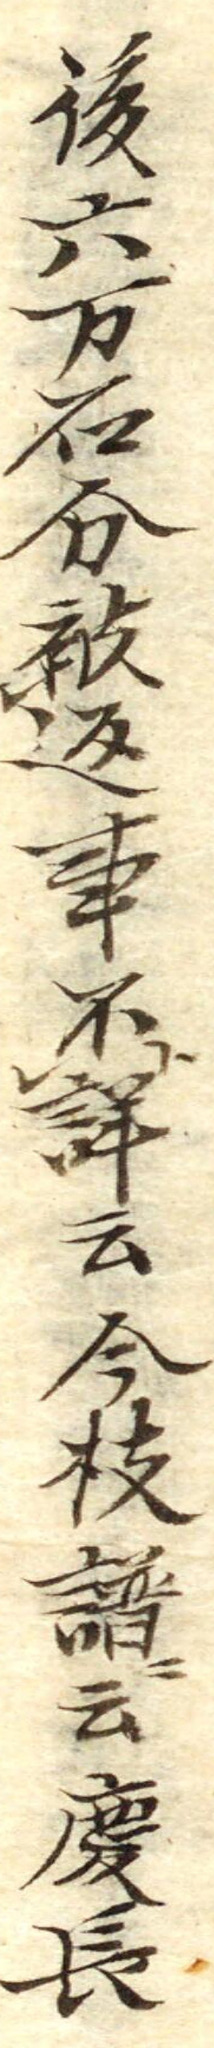後六万石分被返事不と詳云今枝譜に云慶長
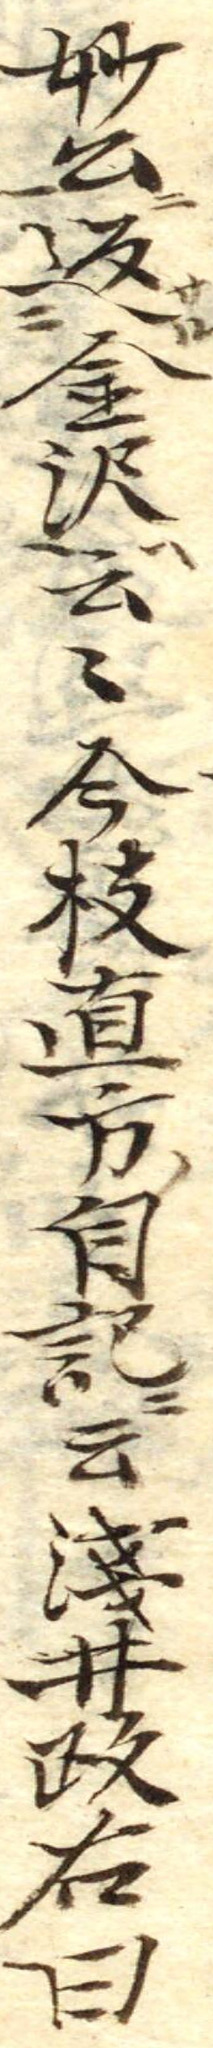妙公に返さる金沢へ云々今枝直方の自記に云浅井政右曰
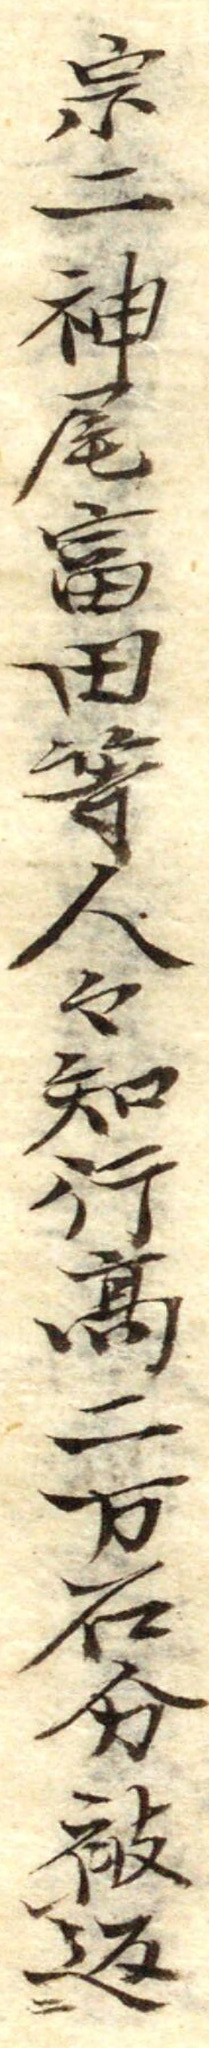宗二神尾富田等人々知行高二万石分被返

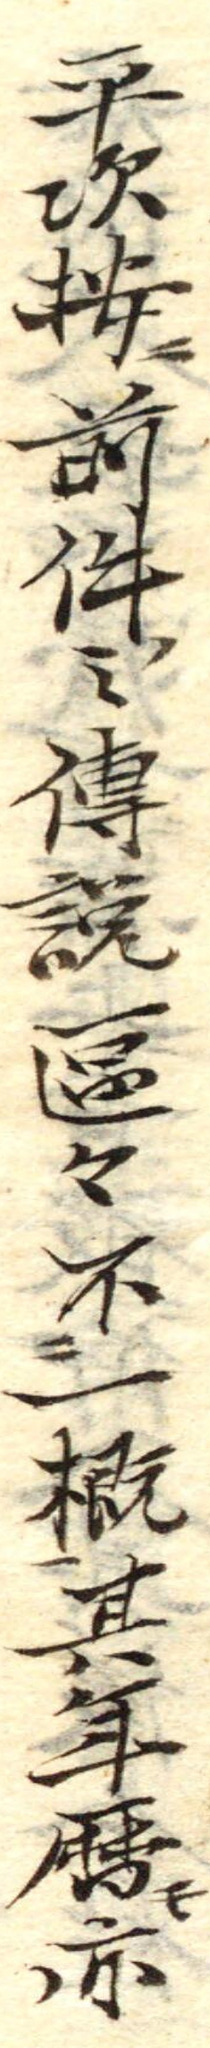平次按に前件之傳説區々不一概其年歴も亦
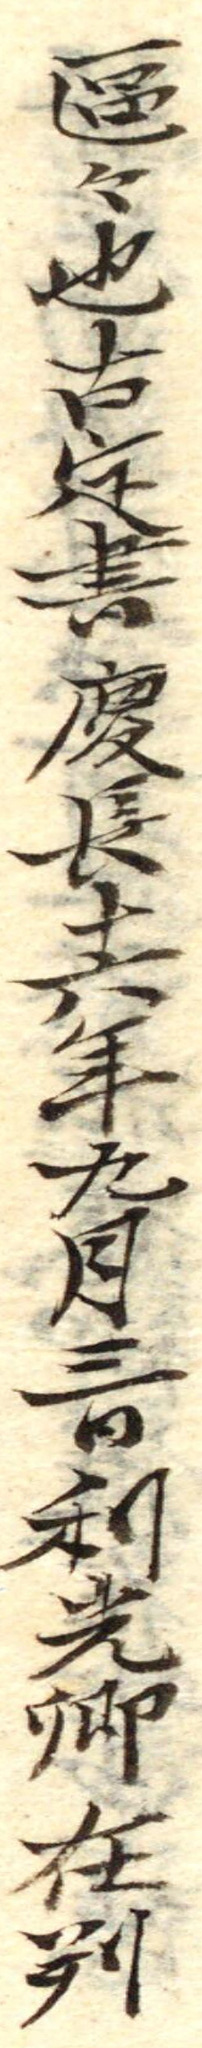區々也古定書慶長十六年九月三日利光卿在判
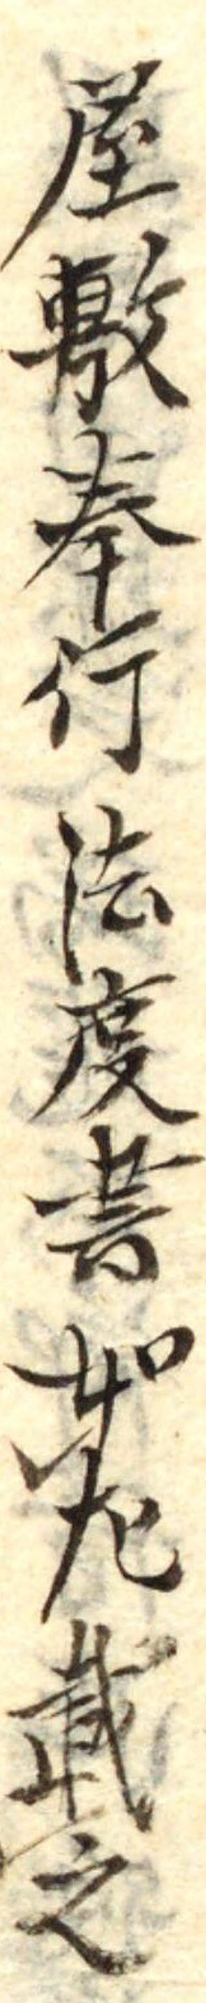屋敷奉行法度書如左載之
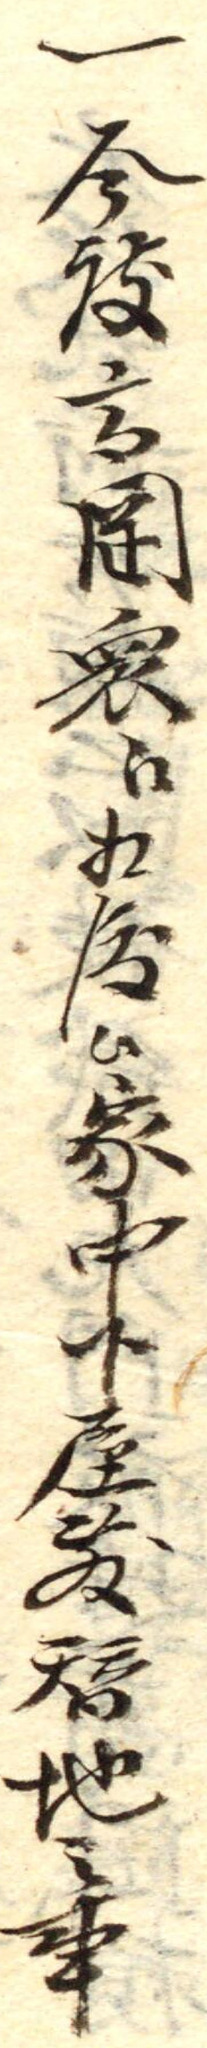一今度高岡衆江相渡候家中下屋敷替地之事
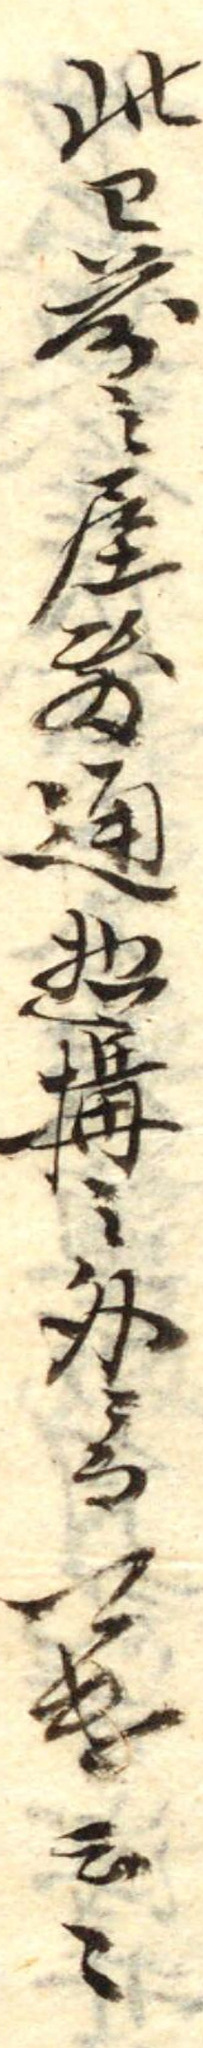此已前之屋敷通相構之外に而可遣云々
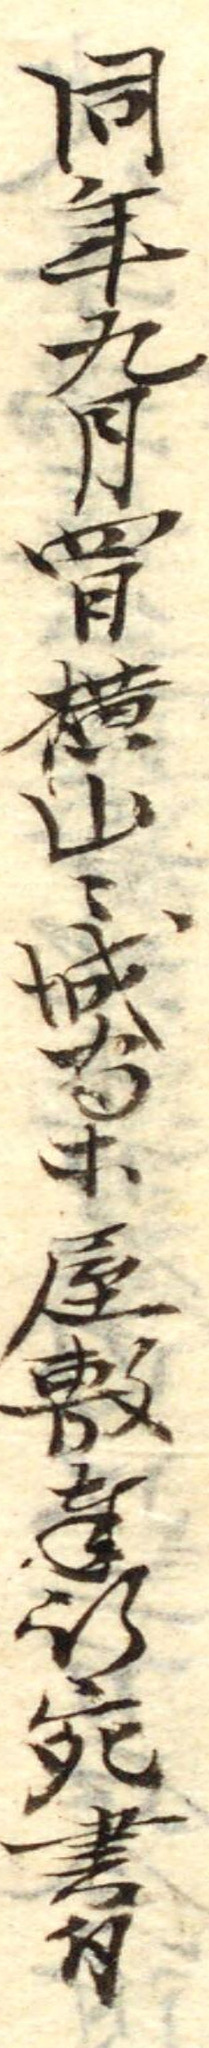同年九月四日横山々城守等屋敷奉行宛書付
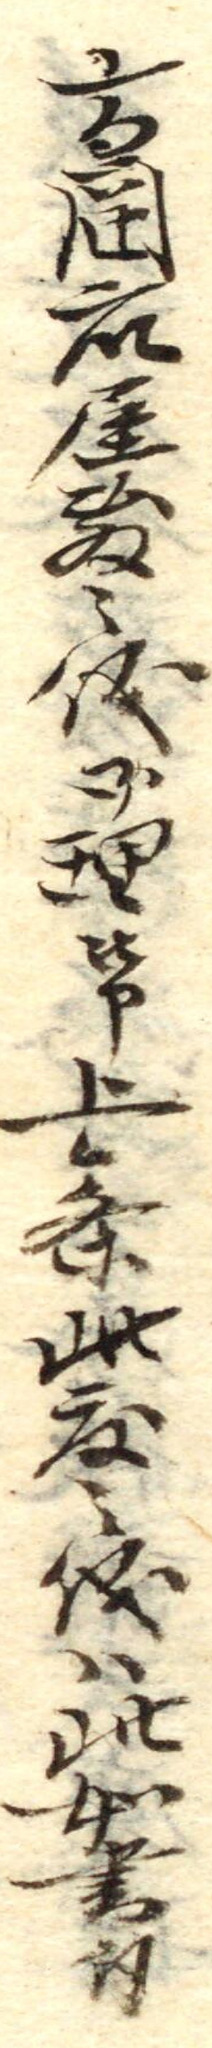高岡衆屋敷之儀御理被申上候条此度之儀は此本書付
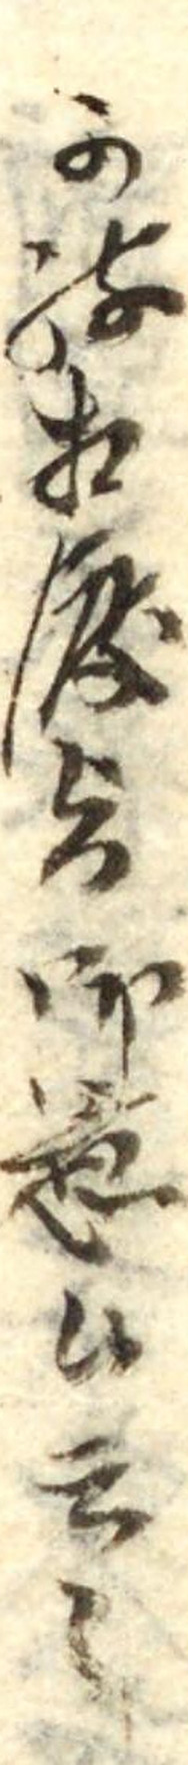可被相渡旨御意候云々
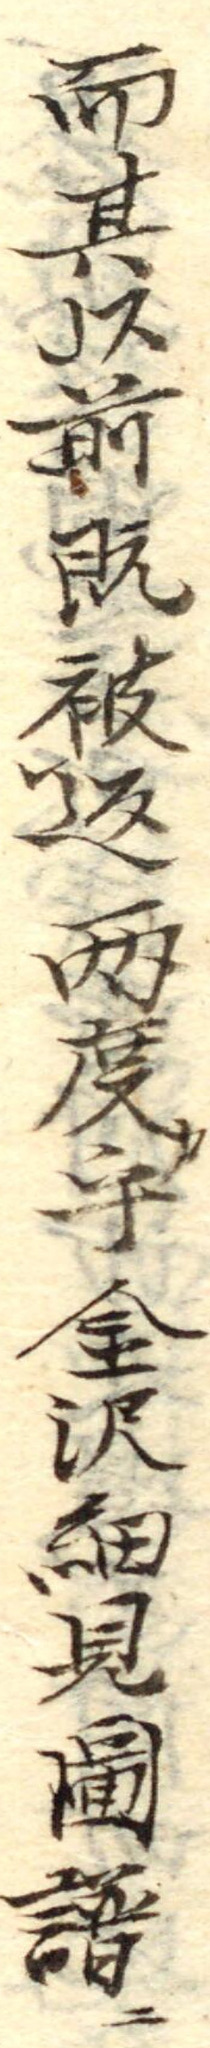而其以前既被返両度も乎金沢細見図譜に
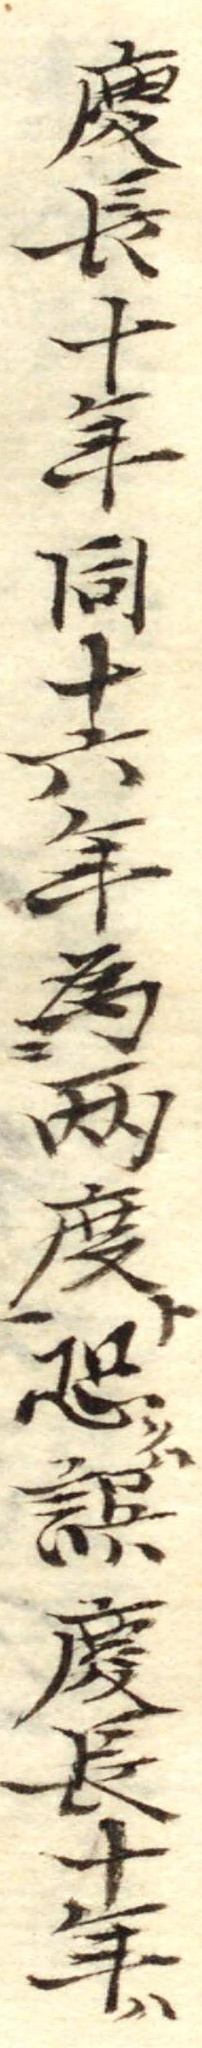慶長十年同十六年為両度と恐くは誤慶長十年は
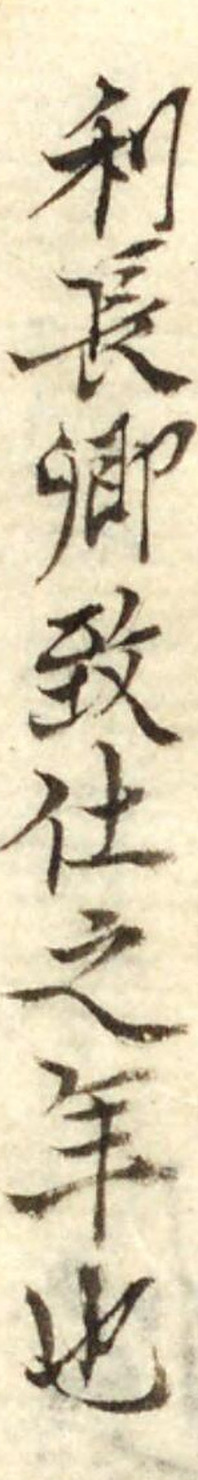利長卿致仕之年也
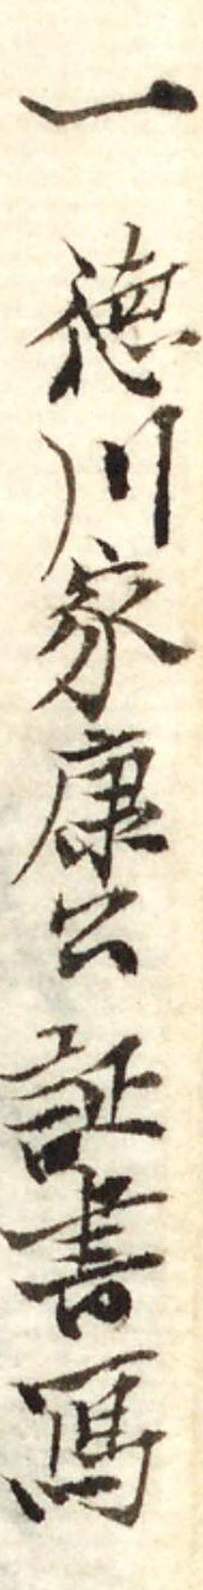一德川家康公証書写
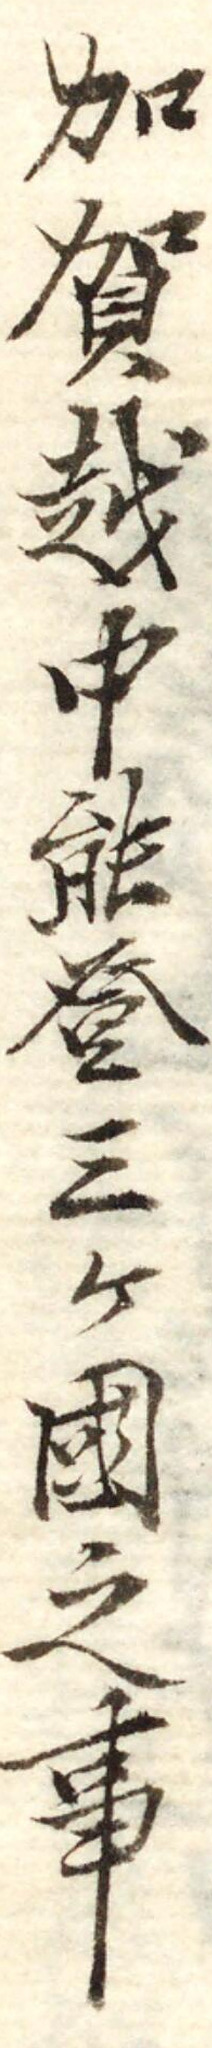加賀越中能登三け国之事
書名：前田家封国証書集録
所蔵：Ishikawa Prefectural Library
